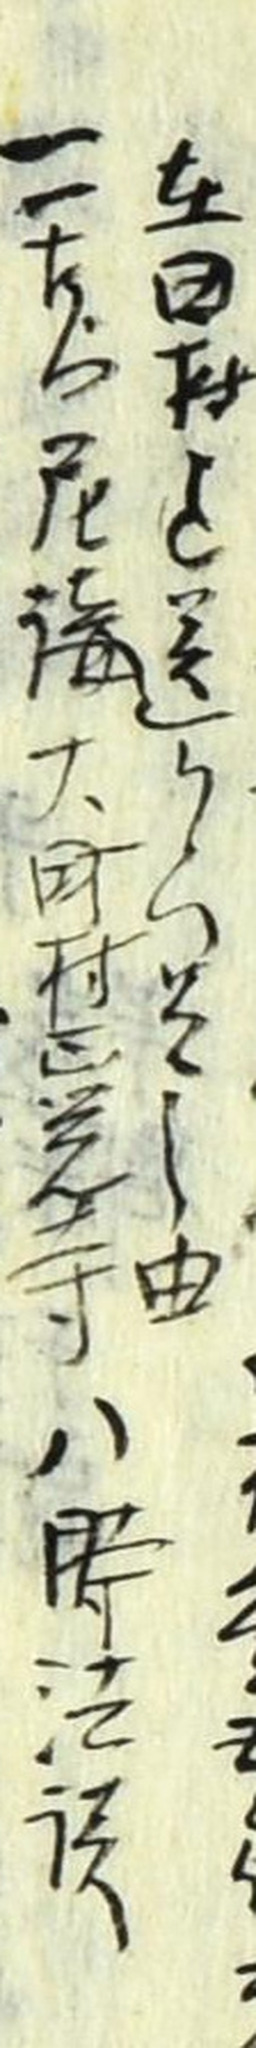二左衛門尼講大町村正覚寺八時法談

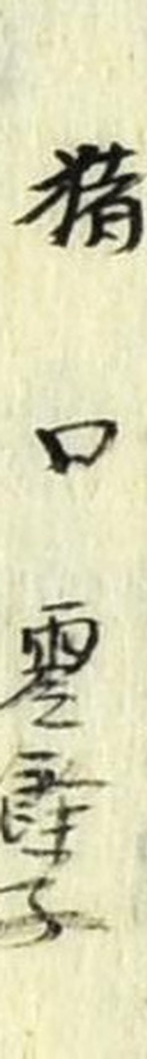猪口零余子
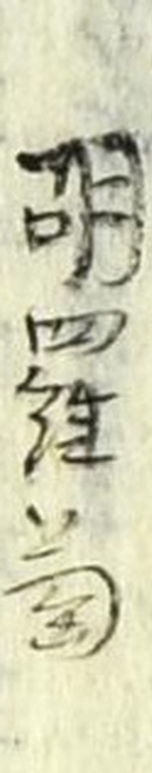胡羅萄
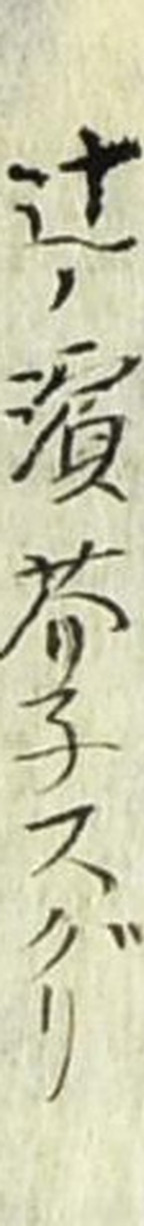辻ノ浜芥子スグリ
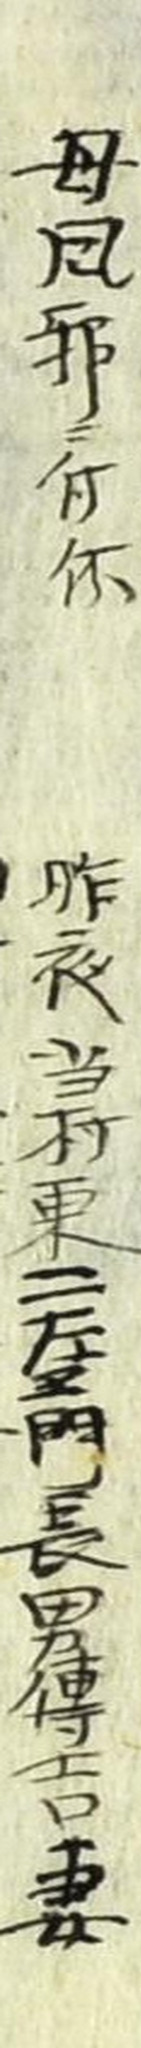母風邪ニ付休昨夜当村東二左ヱ門長男伝吉妻
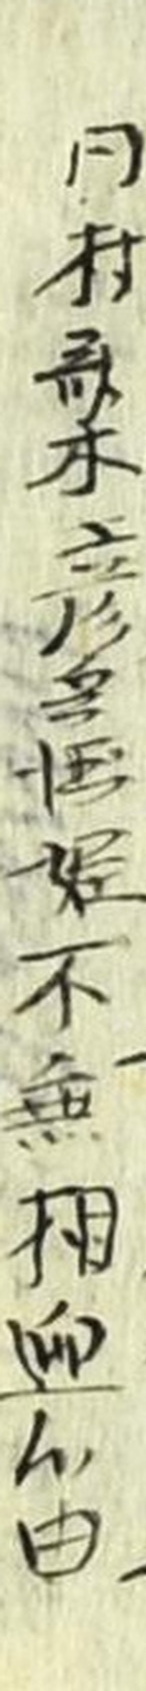同村斉木彦兵衛姪不無相迎候由
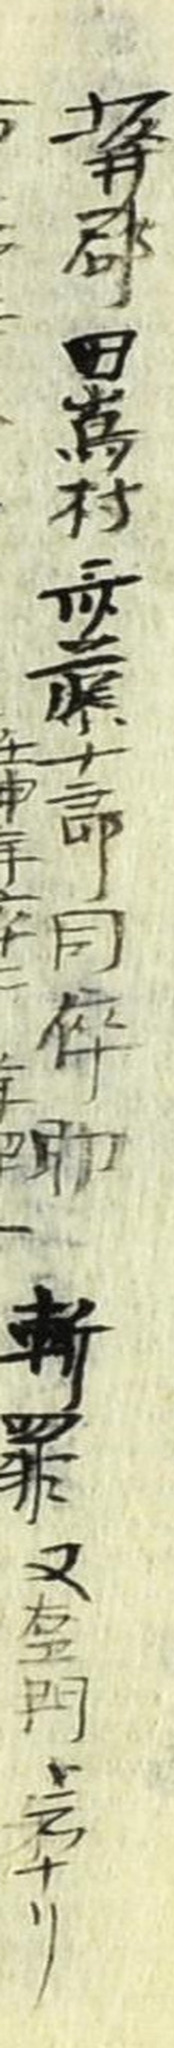坂井郡田島村斉藤十郎同倅助斬罪又右ヱ門ト云ナリ
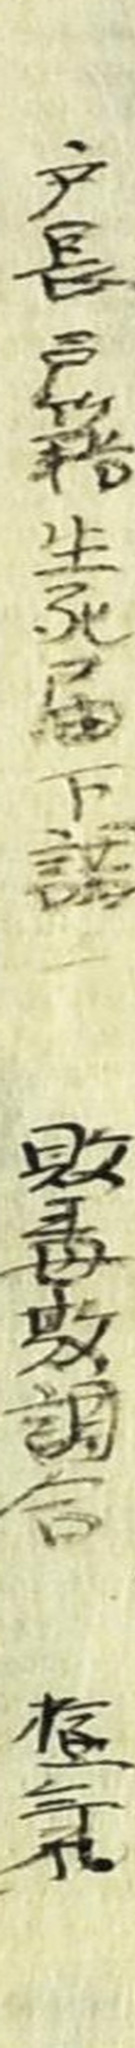戸長戸籍生死届下調敗毒散調合極気
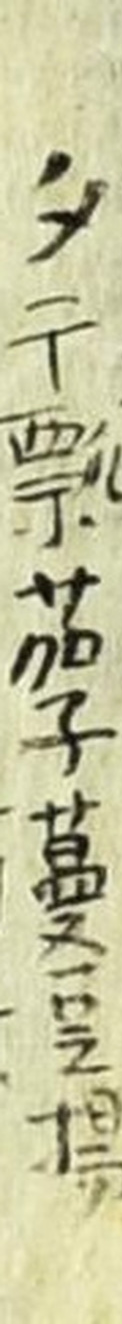同夕干瓢茄子曼豆揚
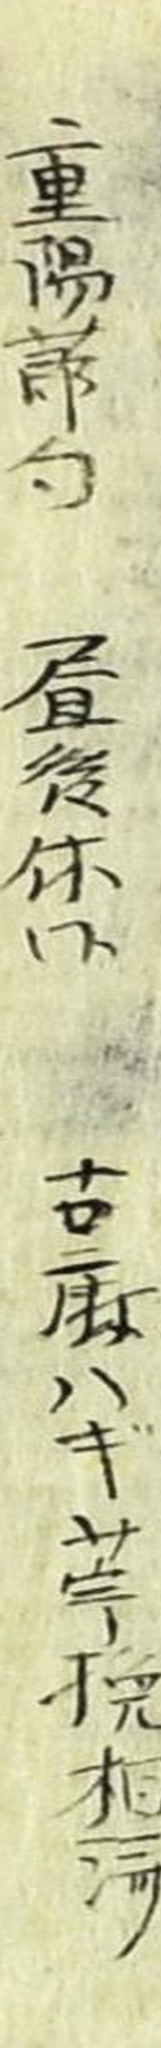重陽節句昼後休候古麻ハギ芋挽相済
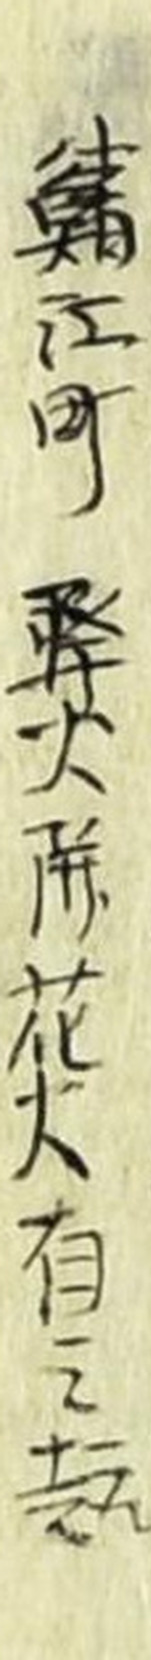鯖江町烽火幷花火有之趣
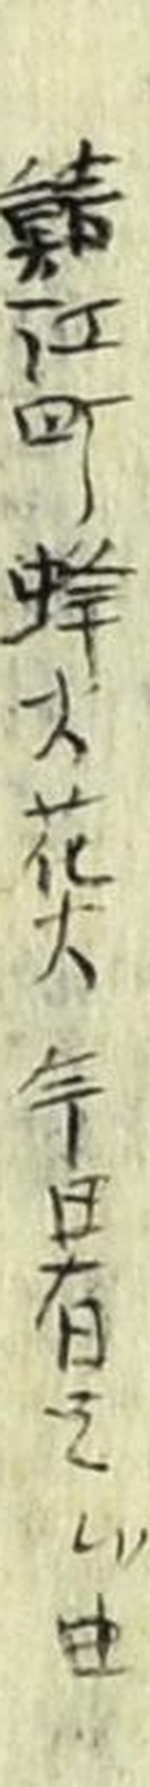同鯖江町蜂火花火今日有之候由
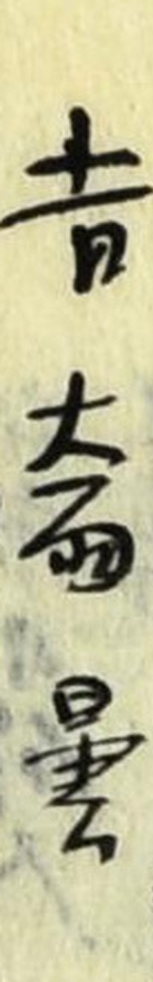十一日大雨曇同
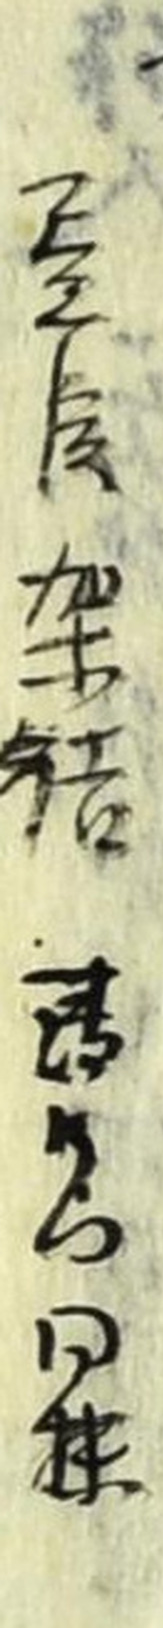同昼後架詰清左衛門同様
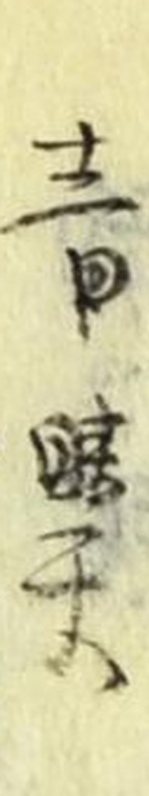十二日晴天
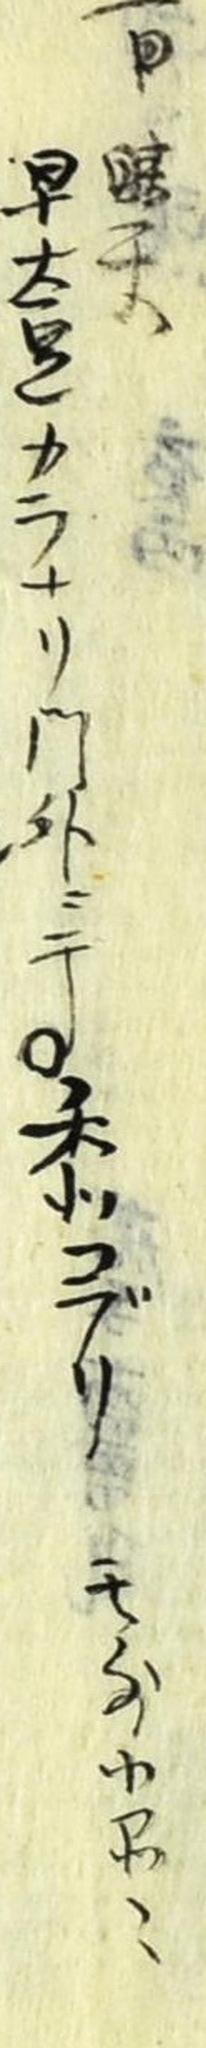早大豆カラナリ門外ニテ○黍コブリ其外小品々
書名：（日記）
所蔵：福井県文書館 Fukui Prefectural Archives
